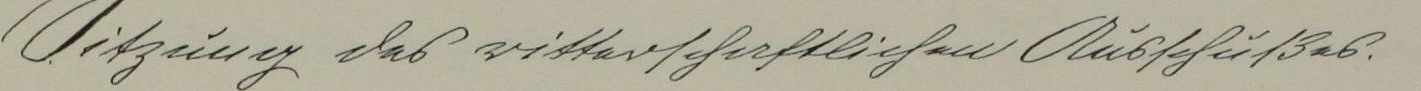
Sitzung des ritterschaftlichen Ausschußes.
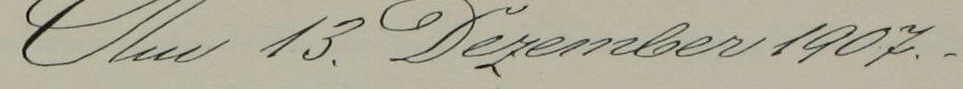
Am 13. Dezember 1907.
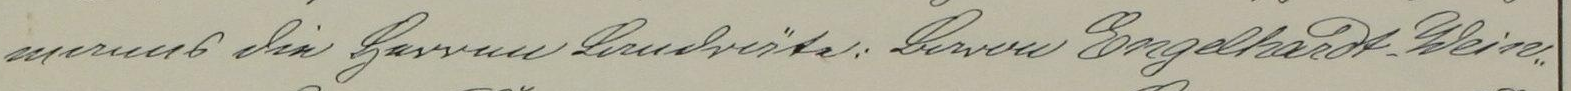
manns die Herren Landräte: Baron Engelhardt-Wein-
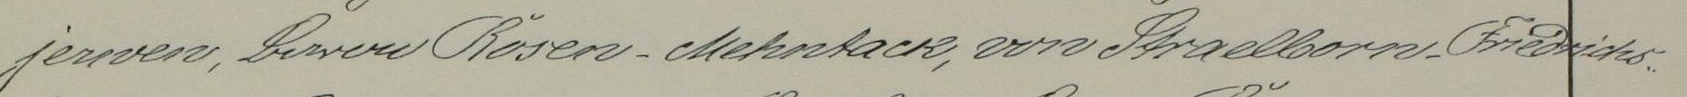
jerwen, Baron Rosen-Mehntack, von Straelborn-Friedrichs-
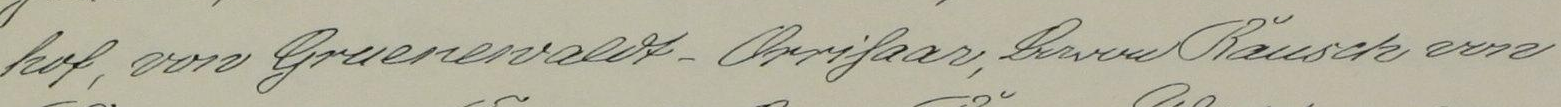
hof, von Gruenewaldt-Orrisaar, Baron Rausch von
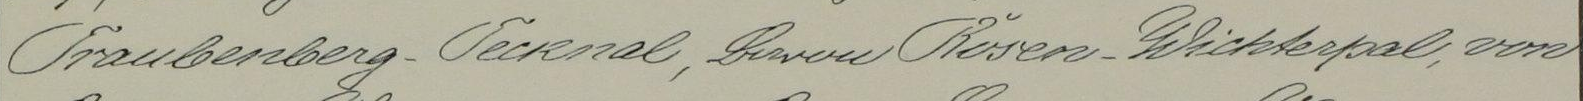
Traubenberg-Tecknal, Baron Rosen-Wichterpal, von
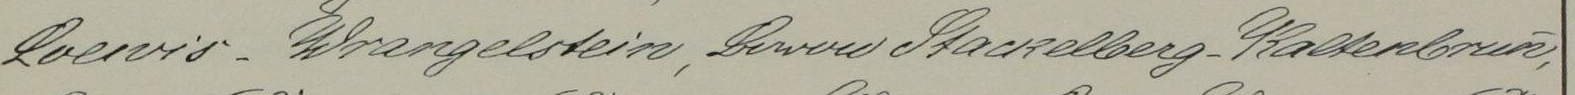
Loewis-Wrangelstein, Baron Stackelberg-Kaltenbrunn,
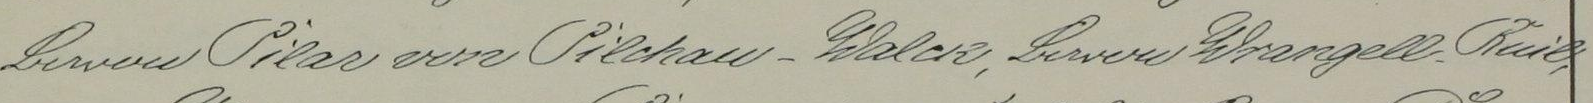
Baron Pilar von Pilchau-Walck, Baron Wrangell-Ruil,
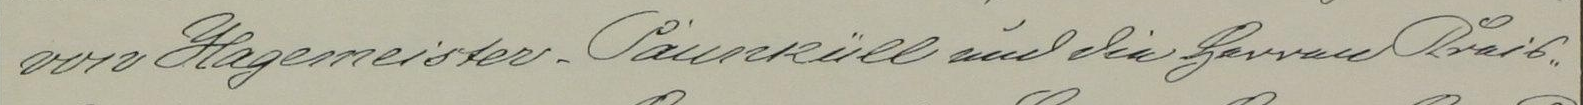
von Hagemeister-Paunküll und die Herren Kreis-
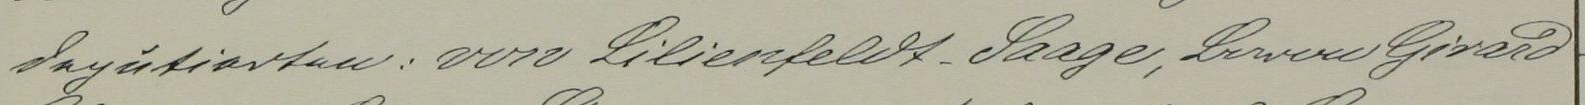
deputierten: von Lilienfeldt-Saage, Baron Girard-
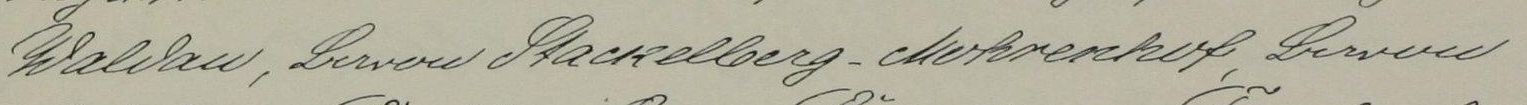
Waldau, Baron Stackelberg-Mohrenhof, Baron
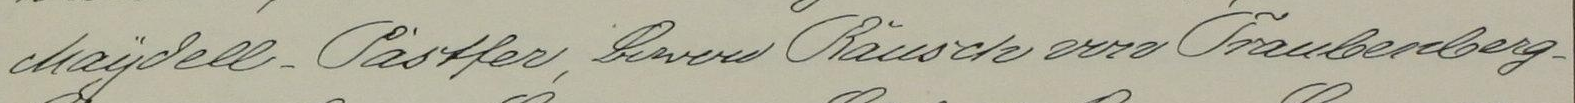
Maydell-Pastfer, Baron Rausch von Traubenberg-
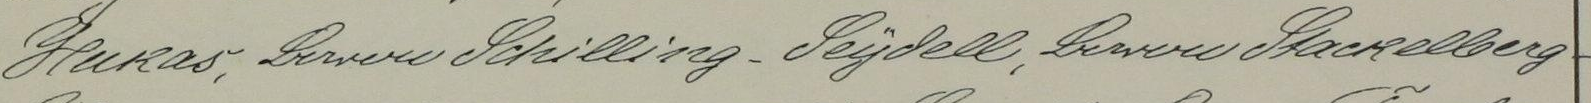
Hukas, Baron Schilling-Seydell, Baron Stackelberg-
